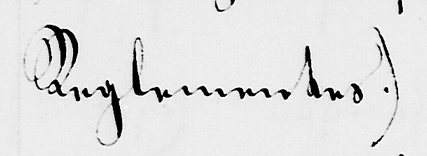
Reglementes.)
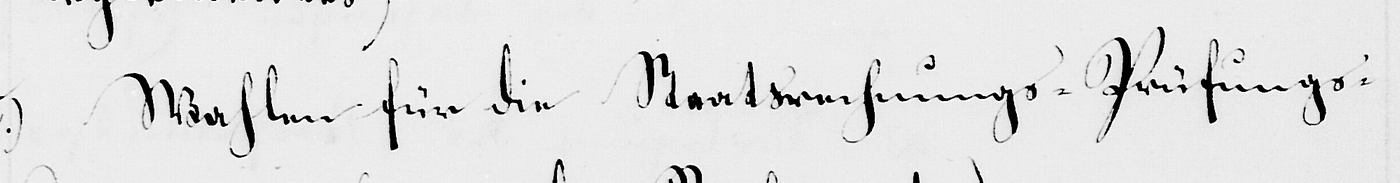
Wahlen für die Staatsrechnungs-Prüfung¬
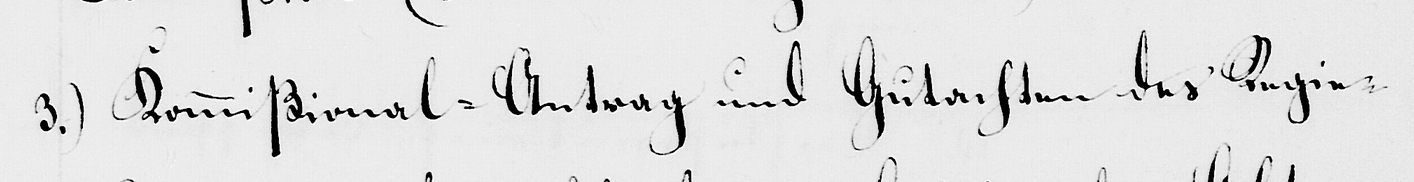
3. Kommißional-Antrag und Gutachten des Regie¬
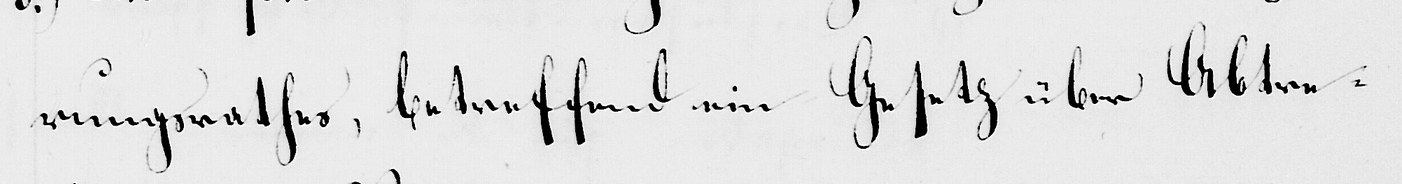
rungsrathes, betreffend ein Gesetz über Abtre¬
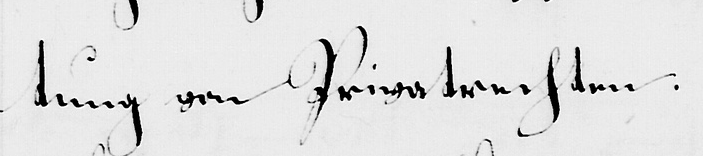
tung von Privatrechten.
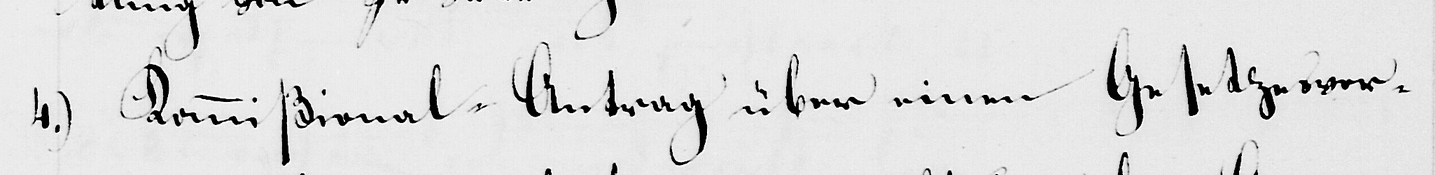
4.) Kommißional-Antrag über einen Gesetzesvor¬
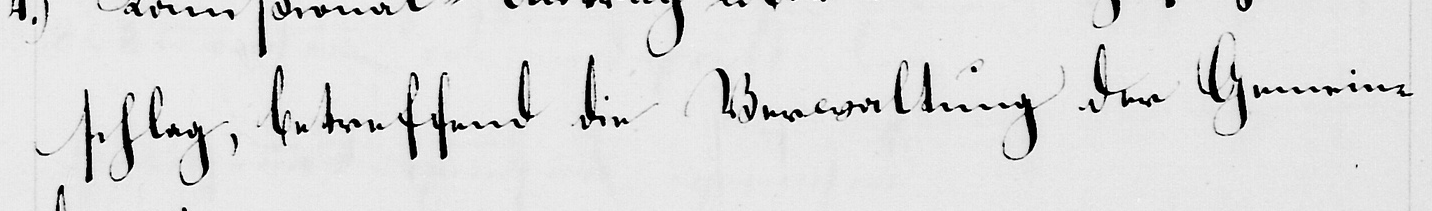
schlag, betreffend die Verwaltung der Gemein¬
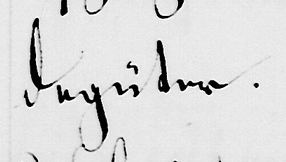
degüter.
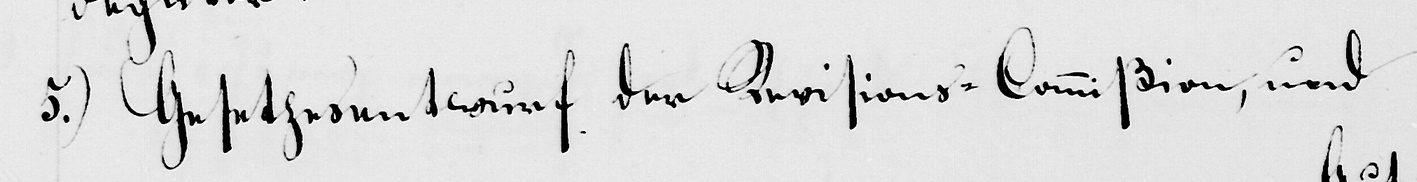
5.) Gesetzesentwurf der Revisions-Commißion, und
